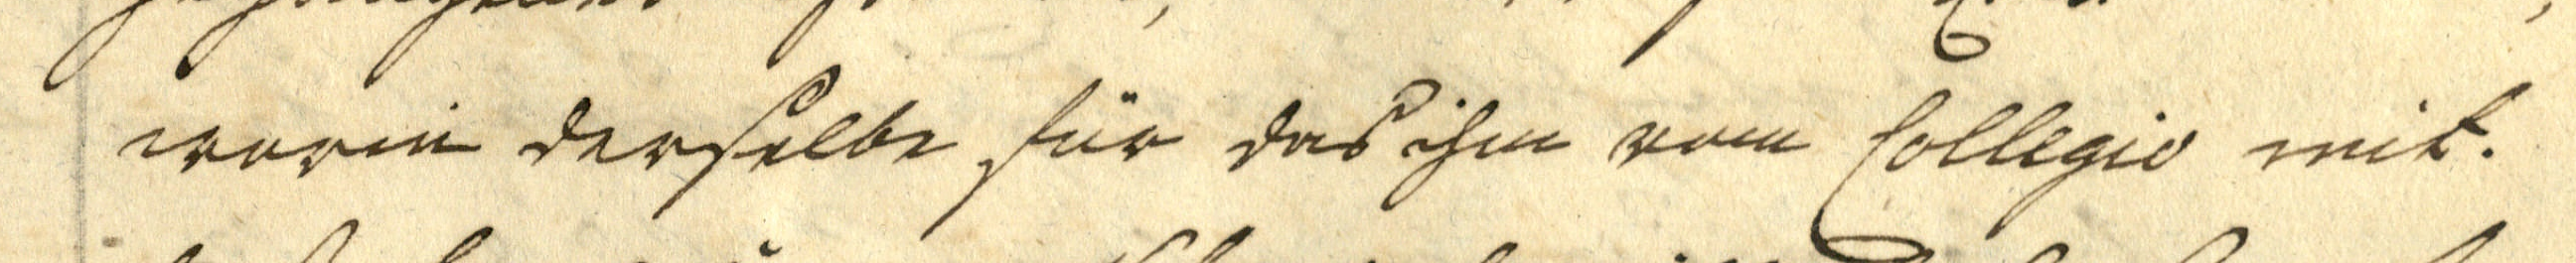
worin derselbe für das ihm vom Collegio mit¬
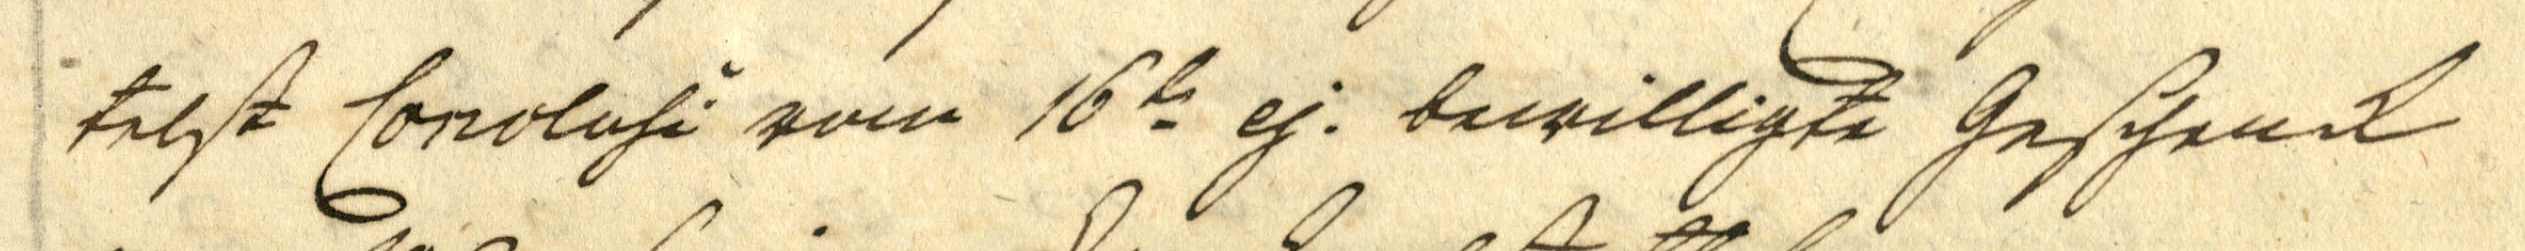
telst Conclusi vom 16 t. ej. bewilligte Geschenck
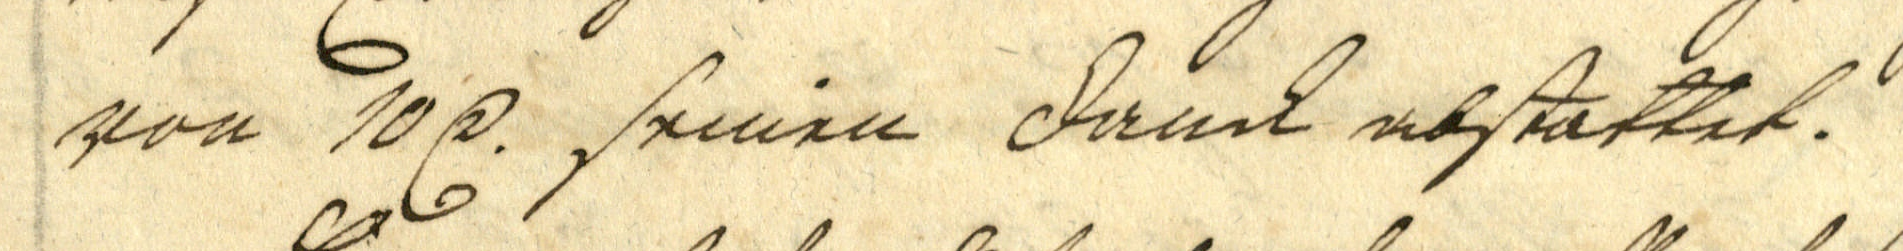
von 10 l. seinen Danck abstattet.
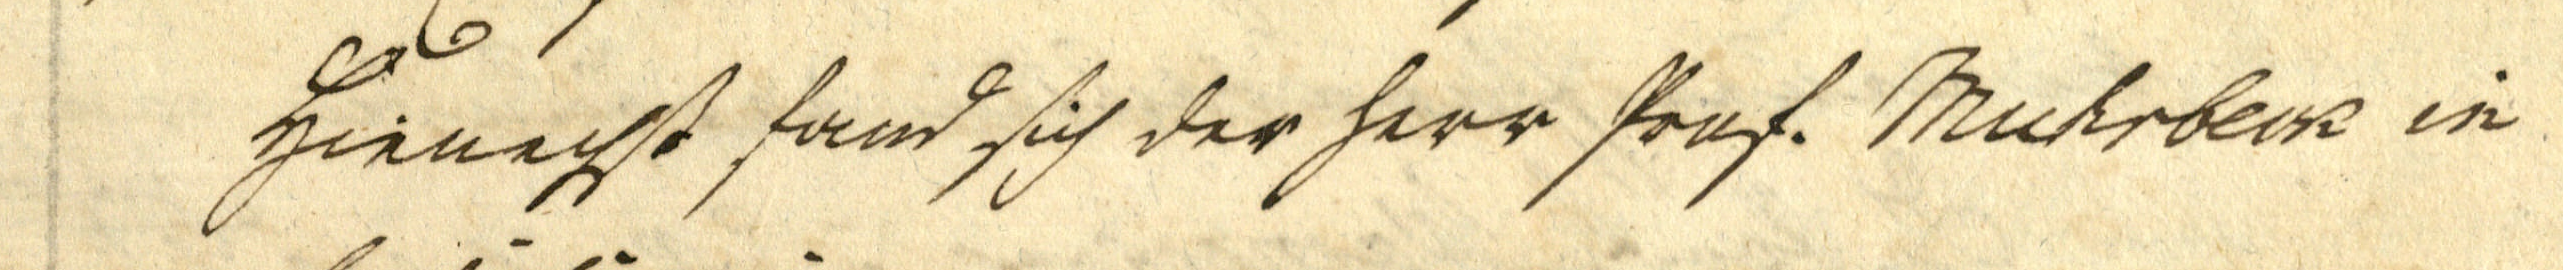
Hienechst fand sich der Herr Prof. Muhrbeck in
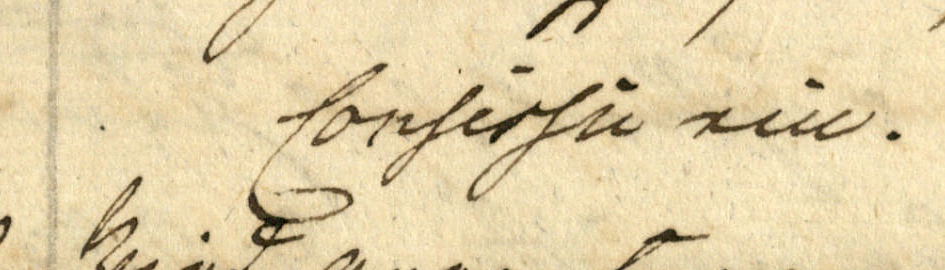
Consessu ein.
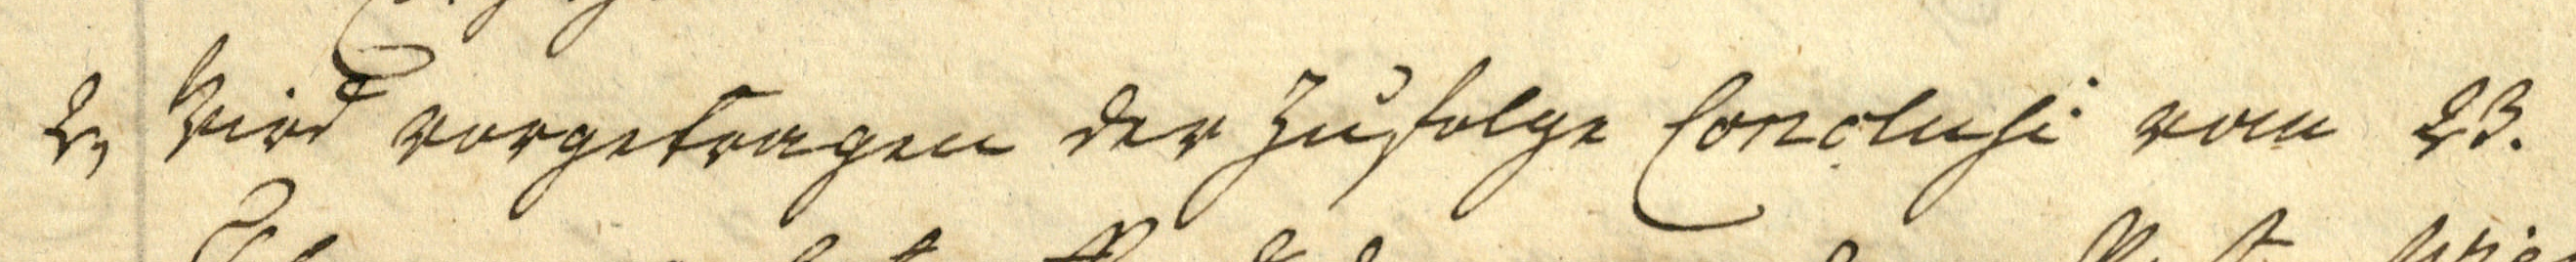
2. Wird vorgetragen der zufolge Conclusi vom 23.
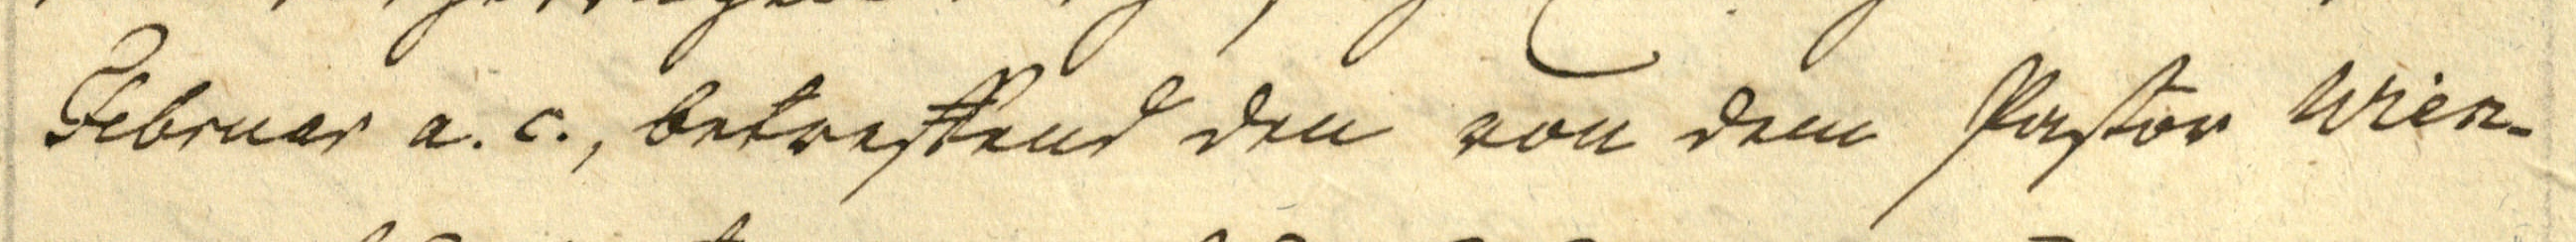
Februar a. c., betreffend den von dem Pastor Wien¬
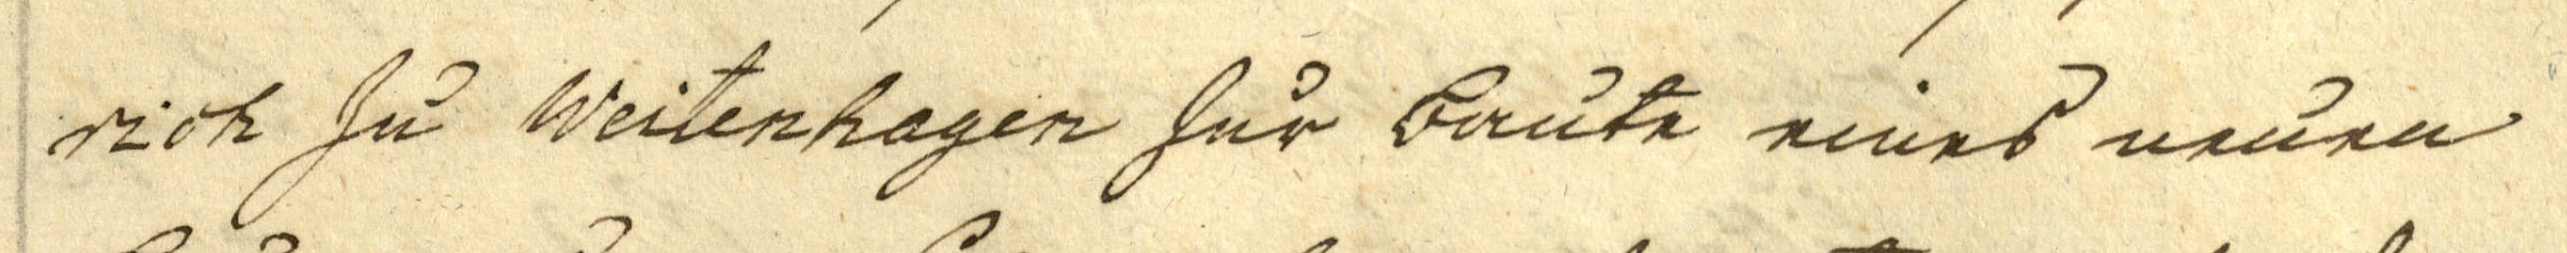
sich zu Weitenhagen zur Baute eines neuen
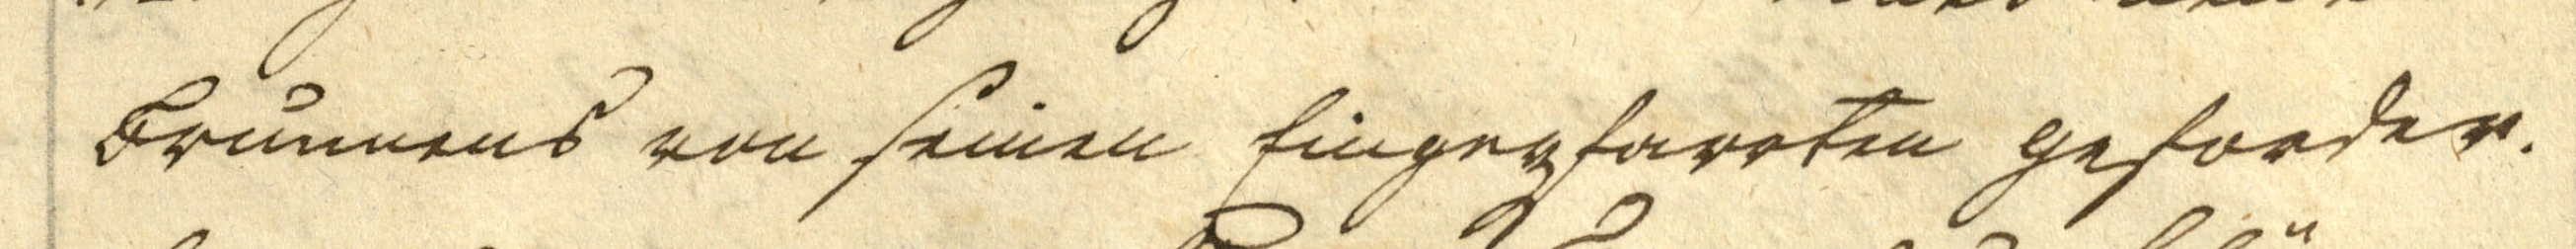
Brunnens von seinen Eingepfarrten geforder¬
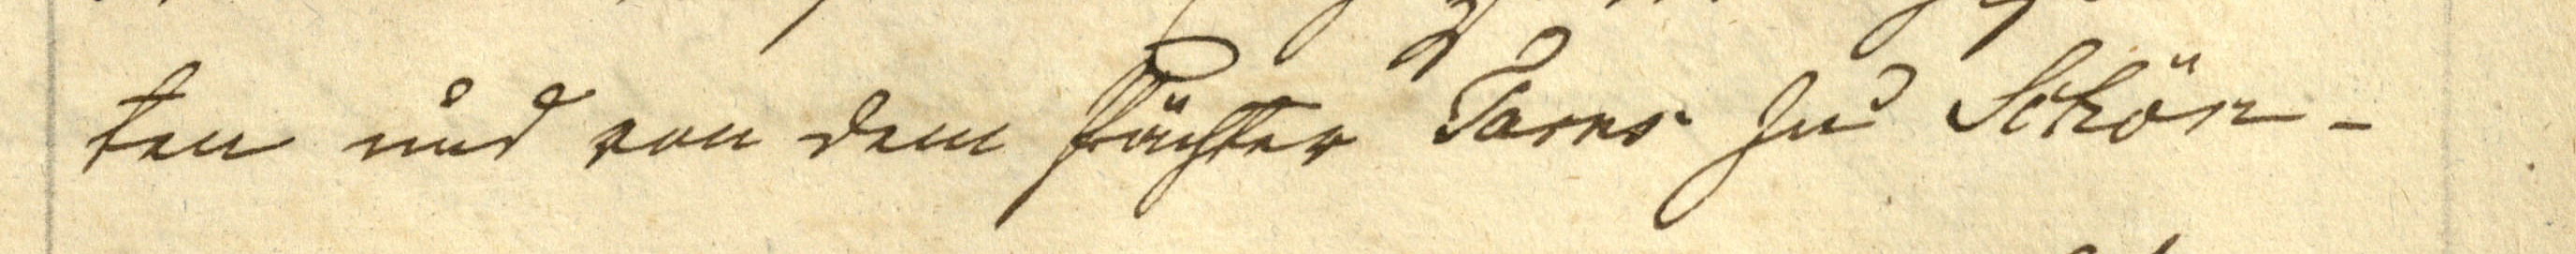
ten und von dem Pächter Tams zu Schön¬
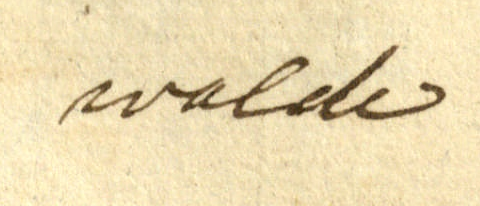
walde
